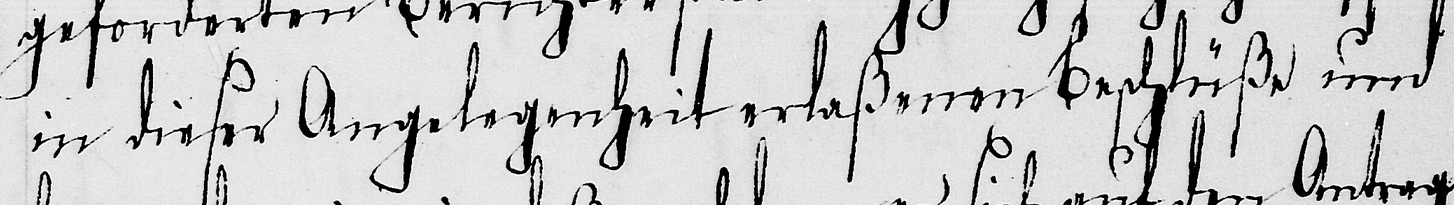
in dieser Angelegenheit erlaßenen Bschlüße und
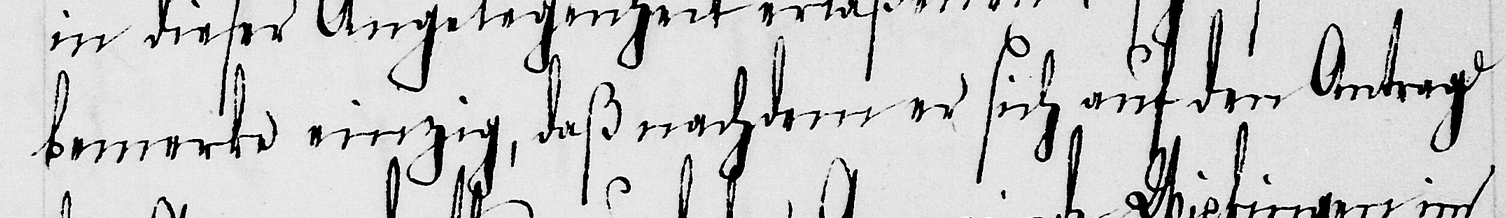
bemerke einzig, daß nachdem er sich auf den Antrag
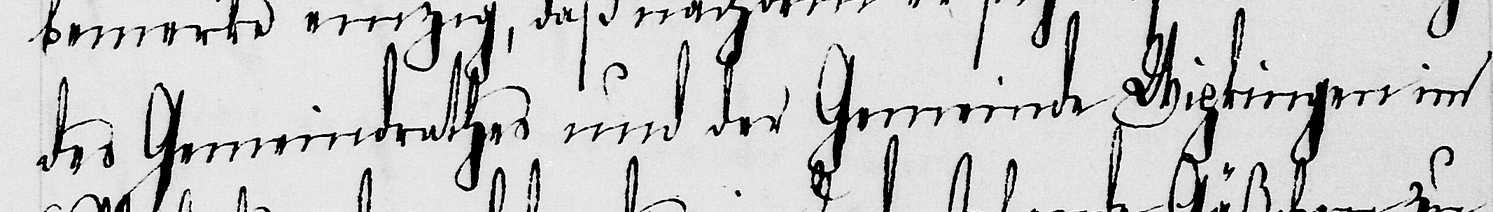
des Gemeindrathes und der Gemeinde Wipkingen im
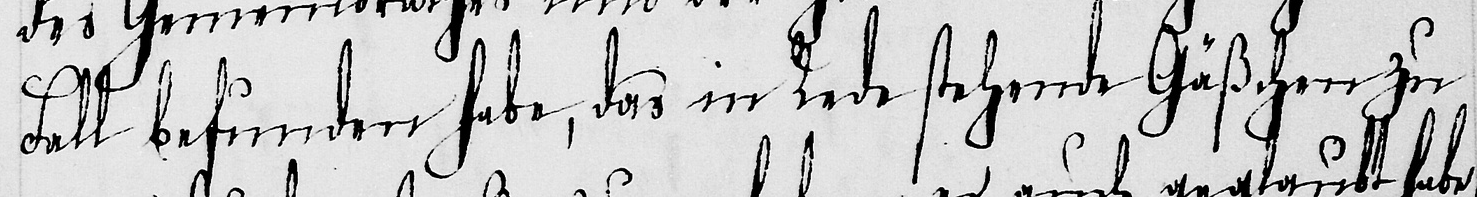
Fall befunden habe, das in Rede stehende Gäßchen zu
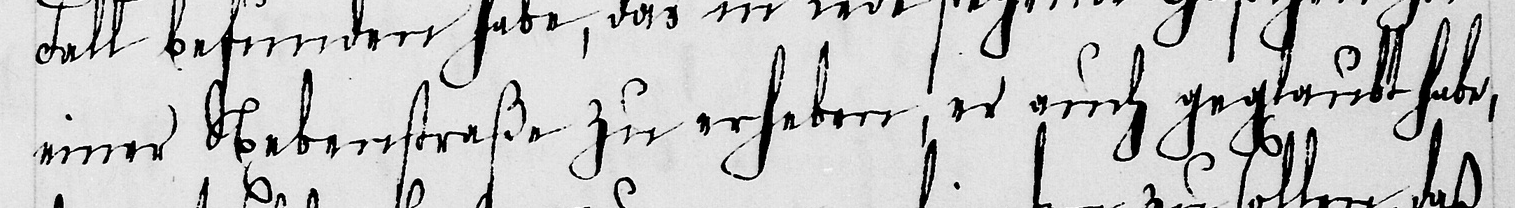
einer Nebenstraße zu erheben, er auch geglaubt habe,
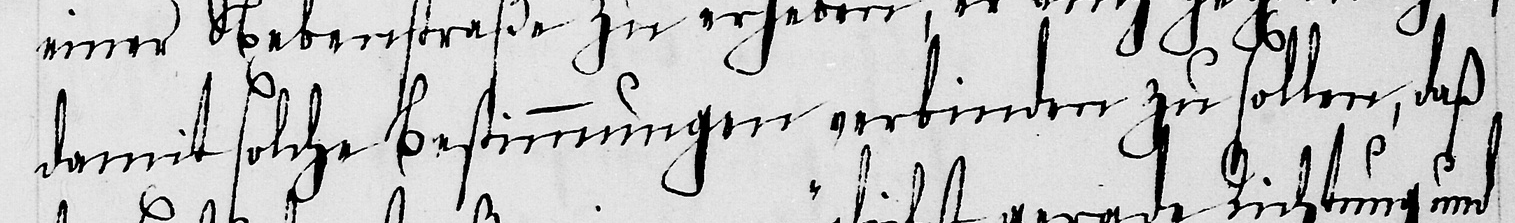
damit solche Bestimmungen verbinden zu sollen, daß
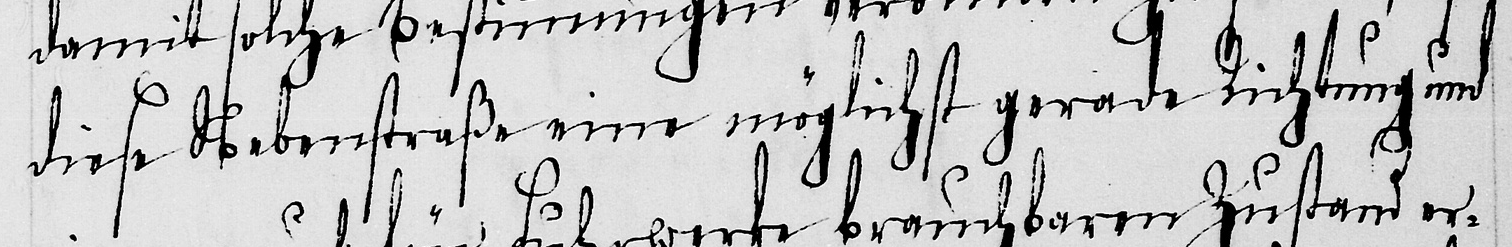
diese Nebenstraße eine möglichst gerade Richtung und
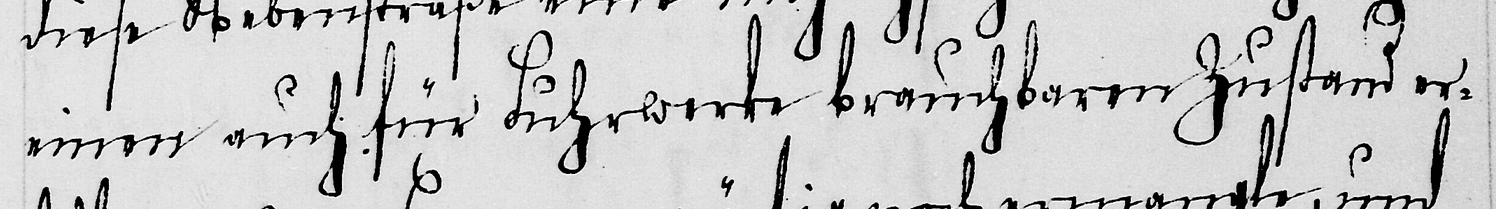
einen auch für Fuhrwerke brauchbaren Zustand er¬
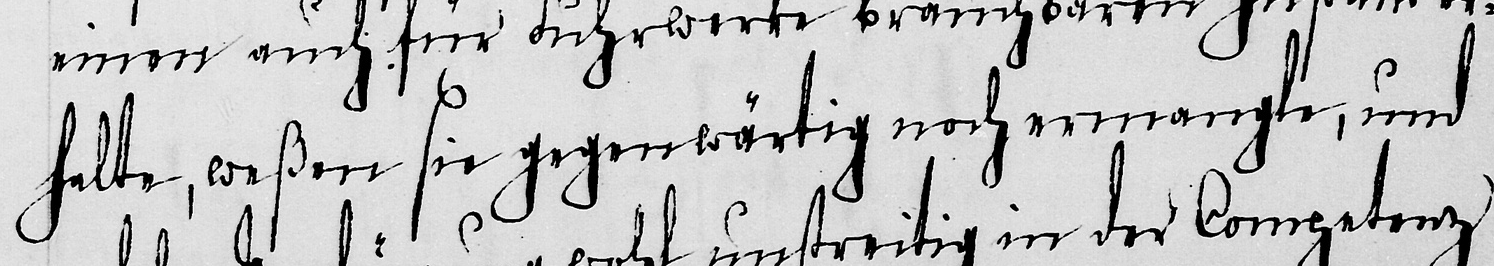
halte, weßen sie gegenwärtig noch ermangle, und
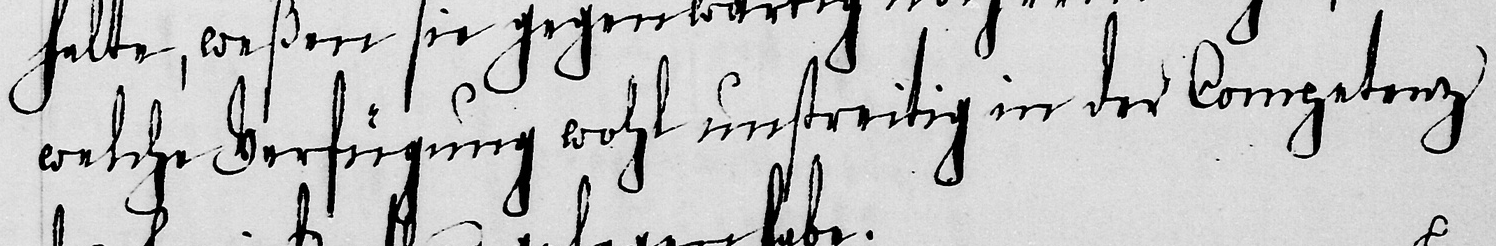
welche Verfügung wohl unstreitig in der Competenz
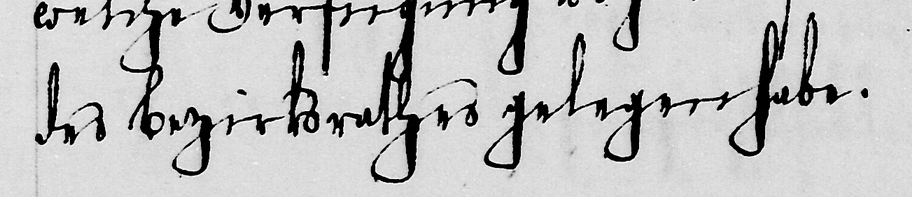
des Bezirksrathes gelegen habe.
